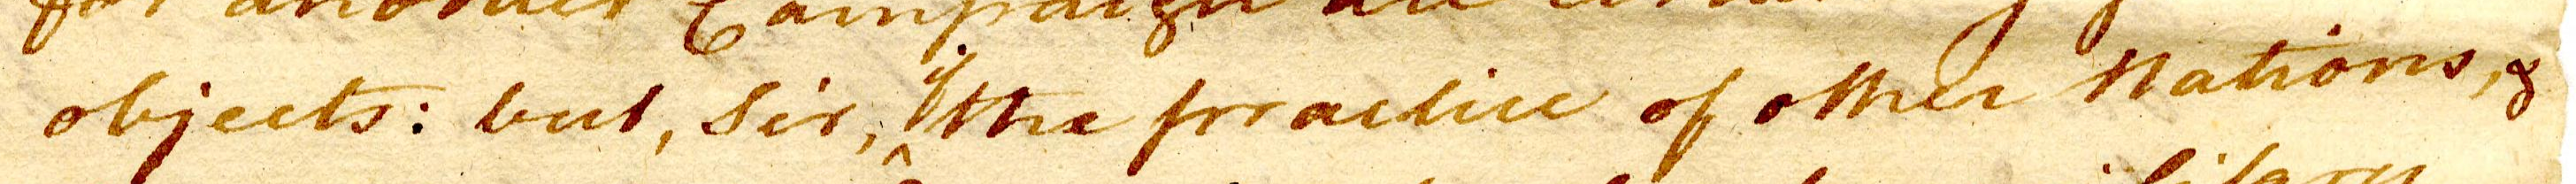objects: but, sir, the practice of other Nations, &
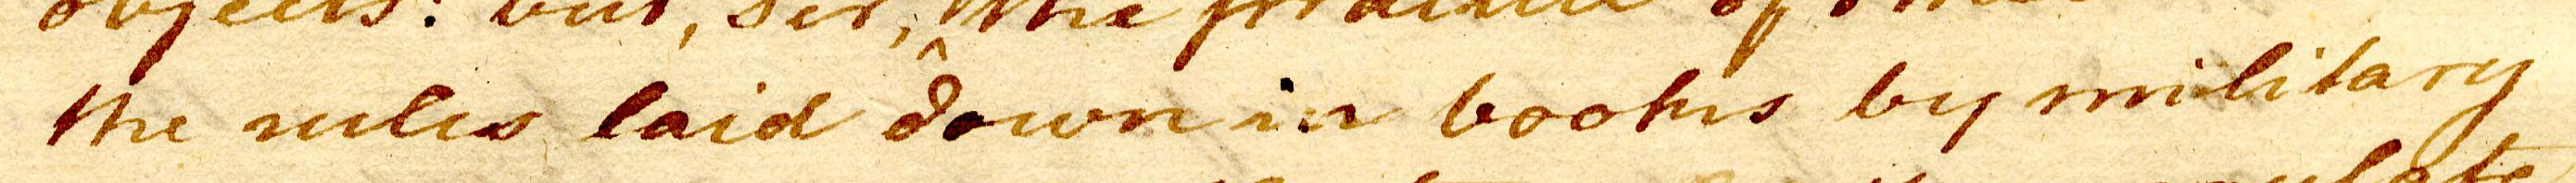the rules laid down i books by military
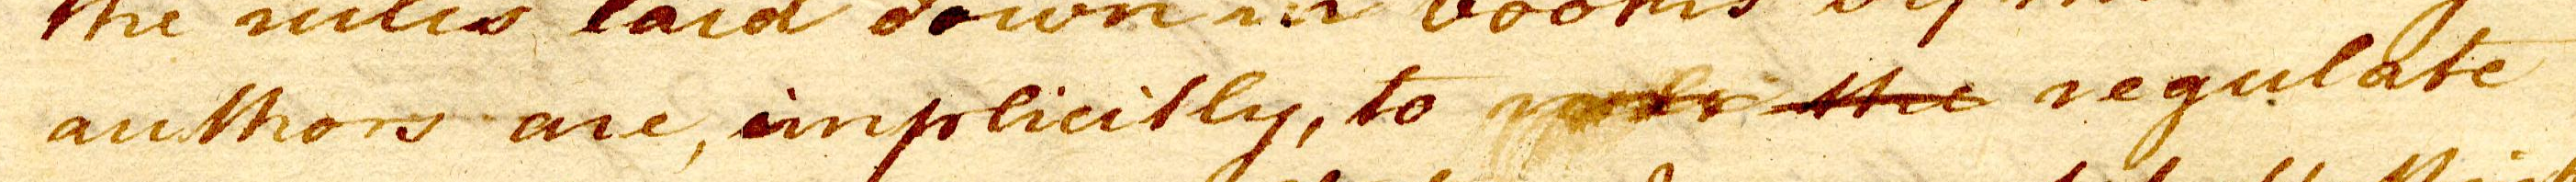authors are, implicitly to [____] [the] regulate
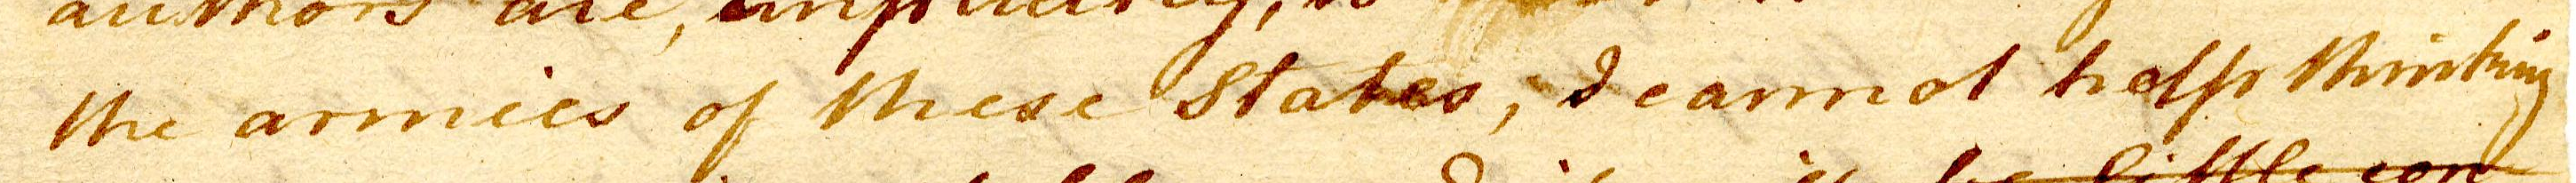the armies of these States; I cannot help thinking
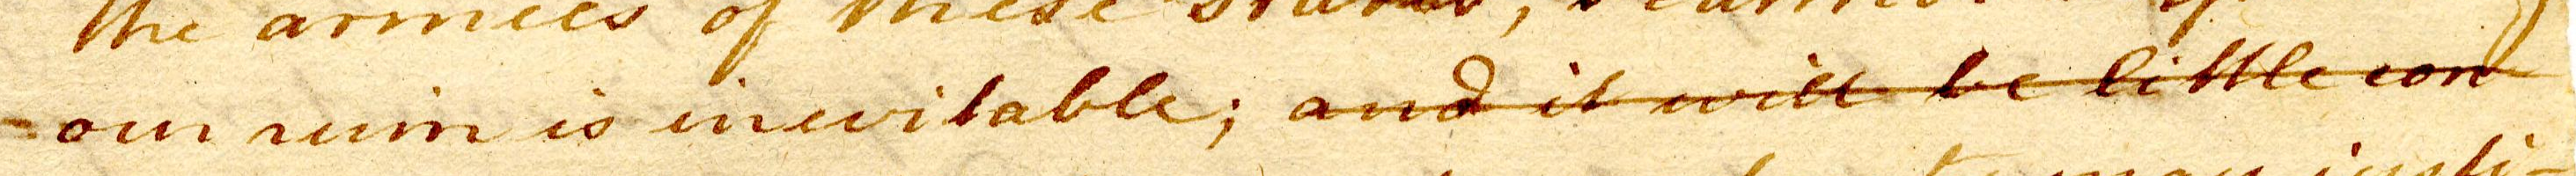our ruin is inevitable; [and it will be little con]
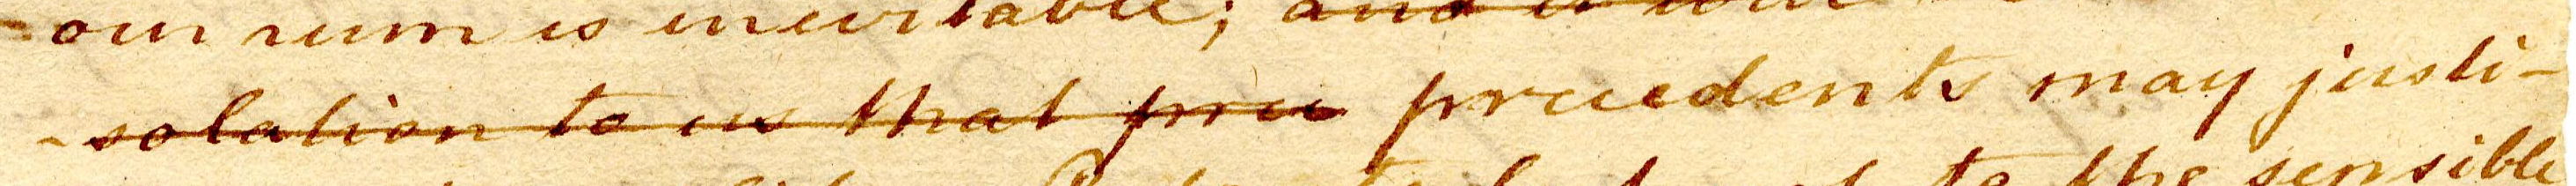[-solation to us that prue] precedents may justi-
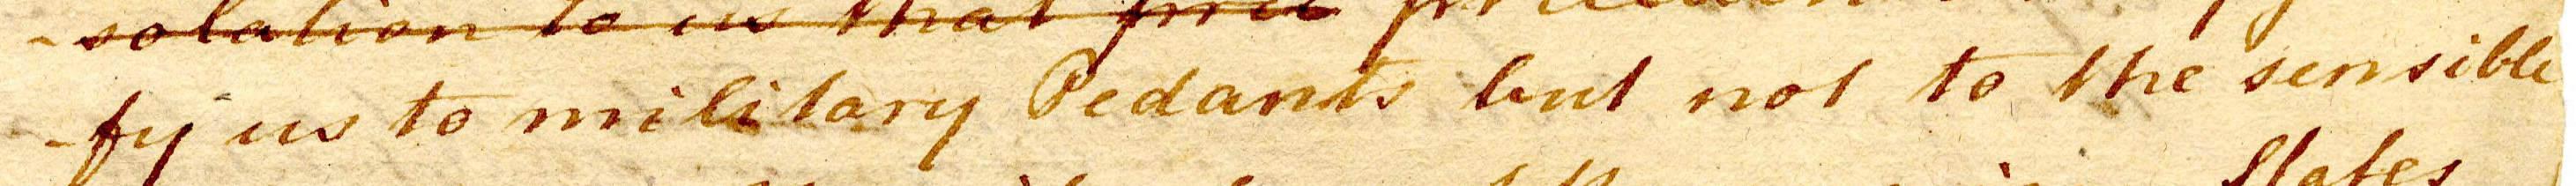-fy us to military Pedants but not to the sensible
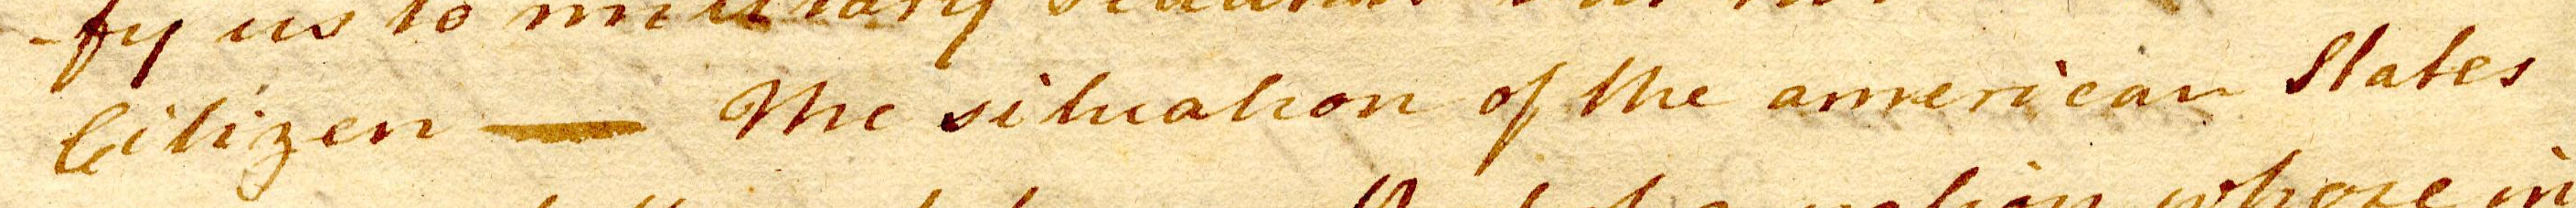Citizen- the situation of the american States
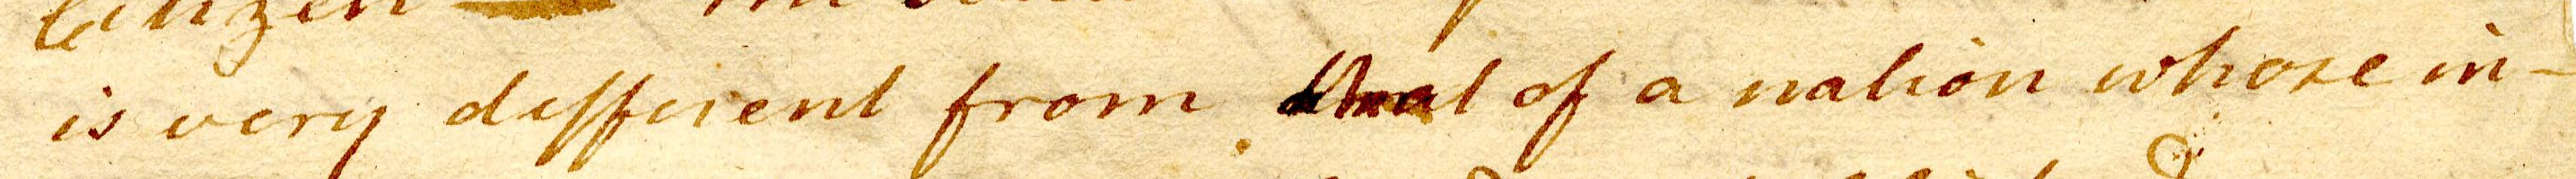is very different from that of a nation whoze in-
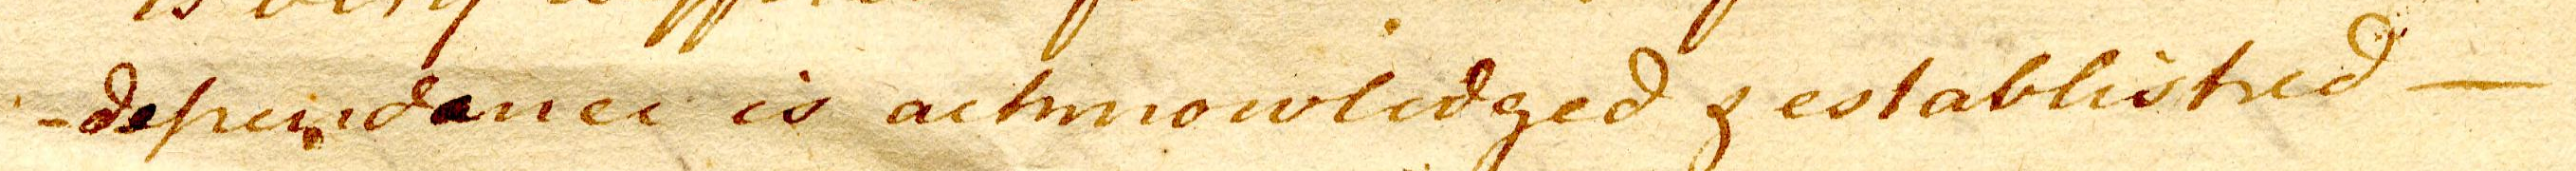-dependence is acknowledged & established-
